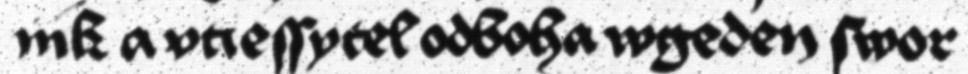ník a vtieſſytel odboha wgeden ſwor
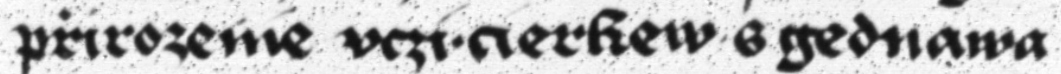pṙirozeníe vczí cíerkew s gednawa
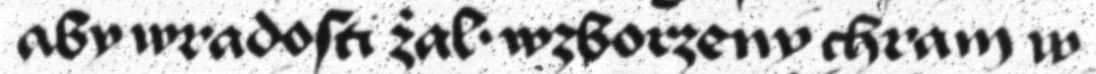aby wradosti żal. wzborzený chram w
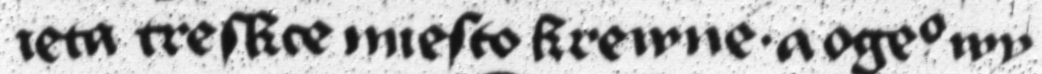ieta treſkce mieſto krewne. a oge° wy
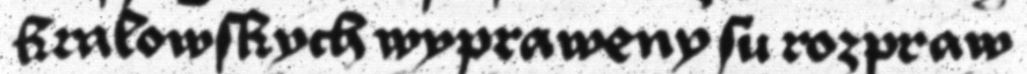kralowských wypraweny ſu rozpraw
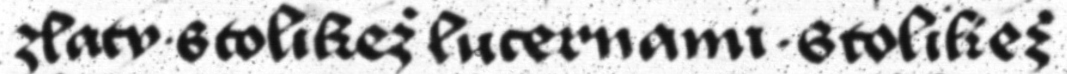zlaty. s tolikeż lucernami s tolikéż
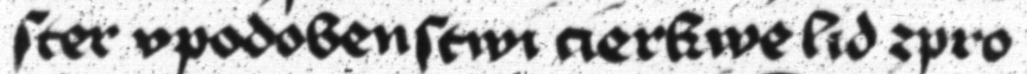ſter vpodobenstwí cíerkwe lid zpro
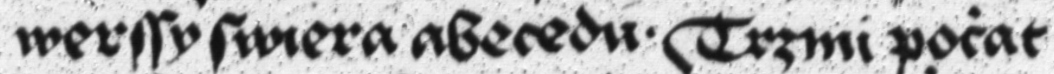werſſy ſwíerá abecedu. Trzmi poċat
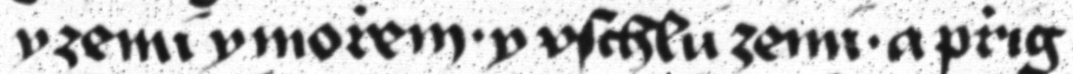y zemí y moṙem. y vſchlú zemí. a pṙig
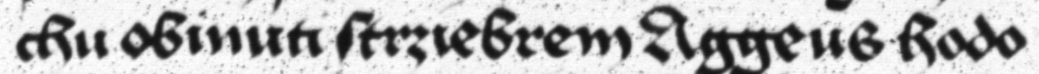chu obinuti ſtrzíebrem Aggeus hodo
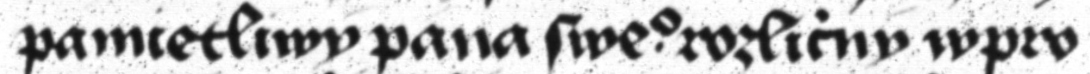pamietliwy pana ſwe° rozličny wpro
